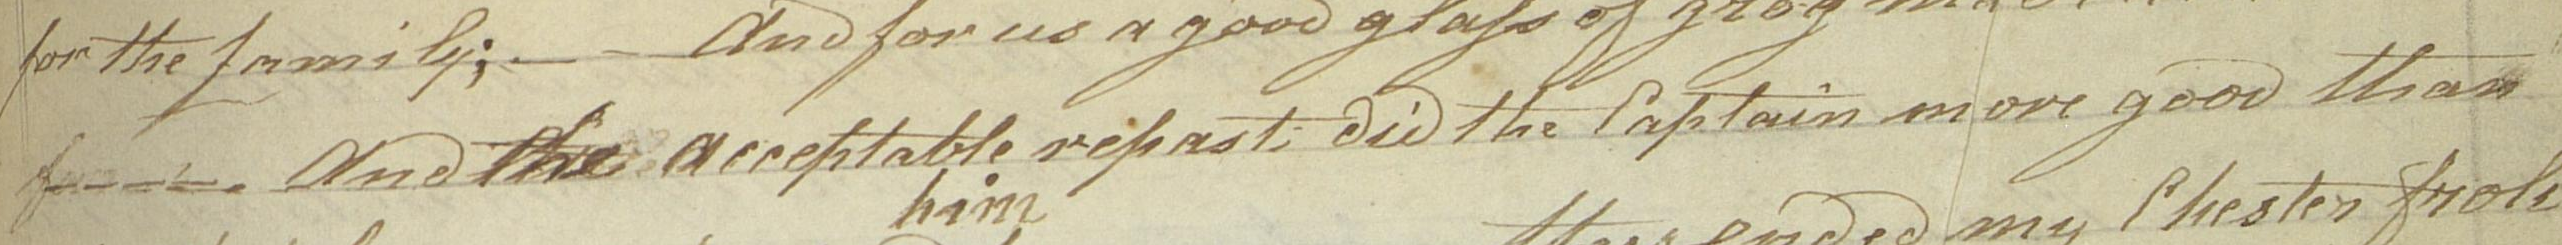And the acceptable repast did the Captain more good than
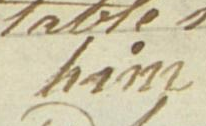him
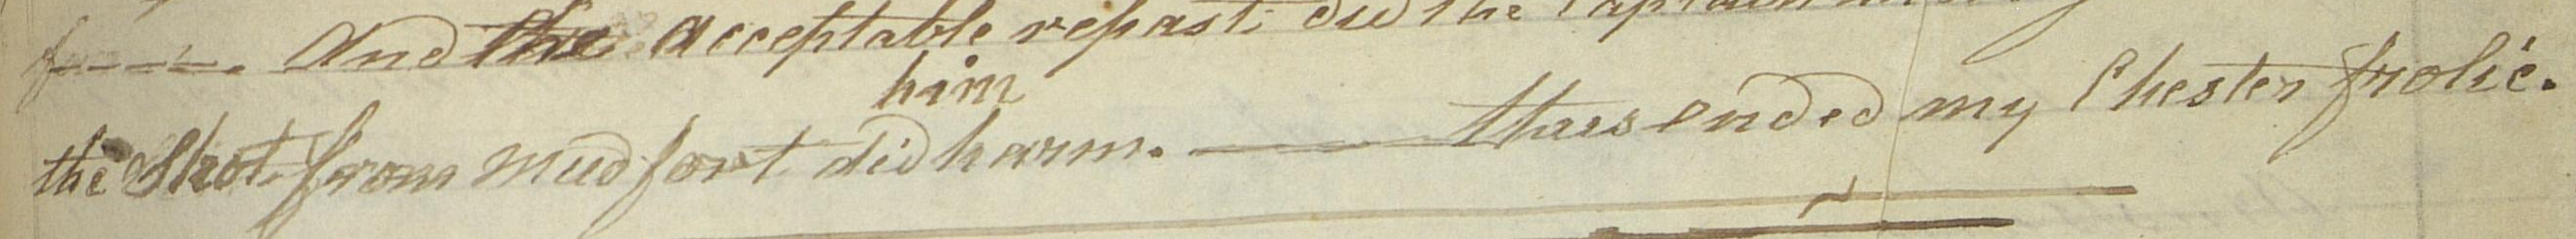the Shot from Mudfort did ^ harm. this ended my Chester frolic.
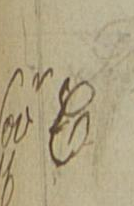C
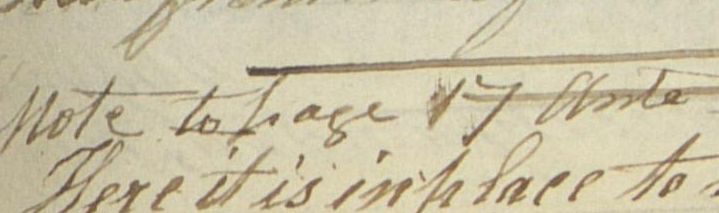Note to page 17 Ante
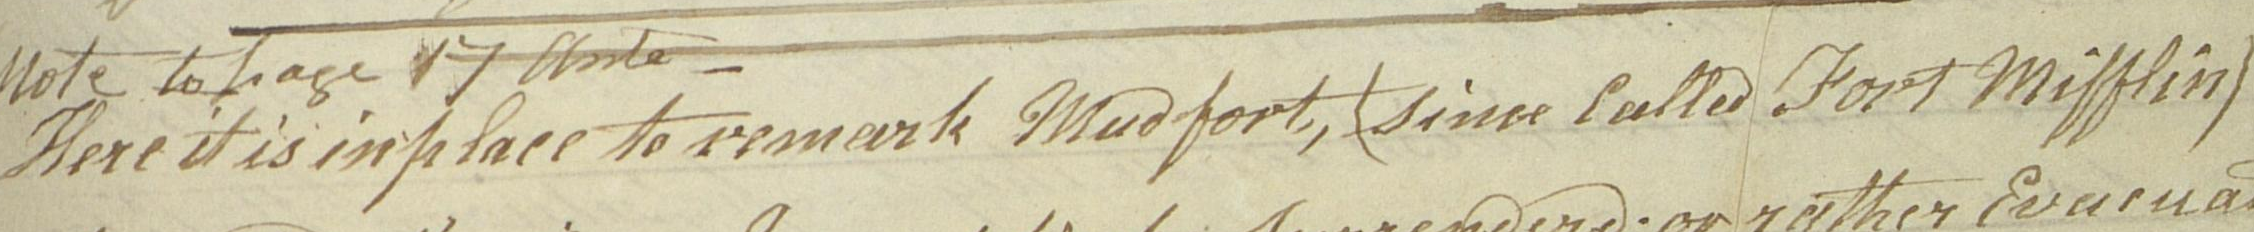Here it is in place to remark Mudfort, (since Called Fort Mifflin)
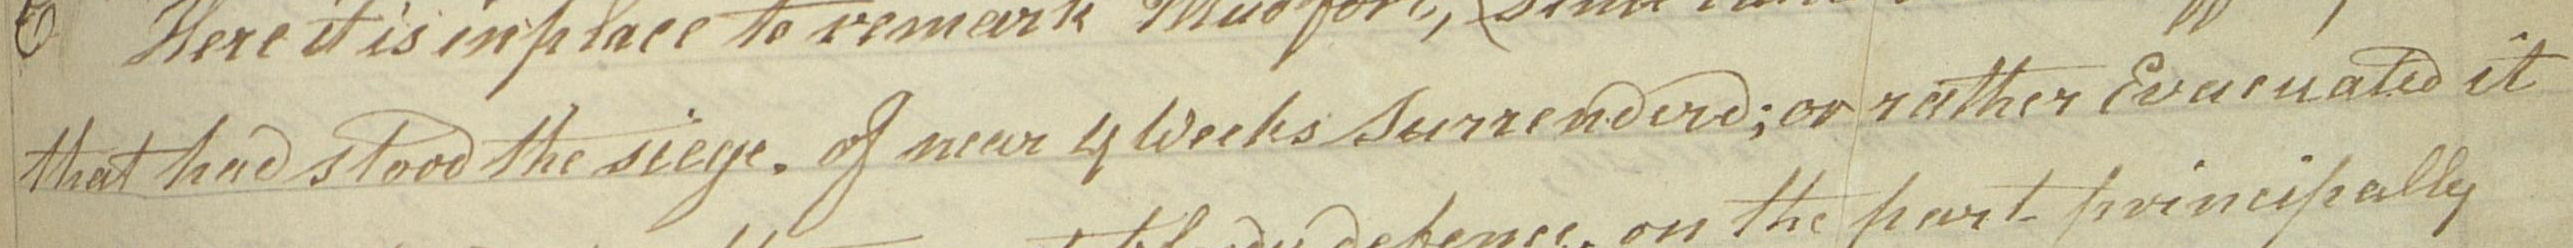that had stood the siege. of near 4 Weeks surrenderd; or rather Evacuated it
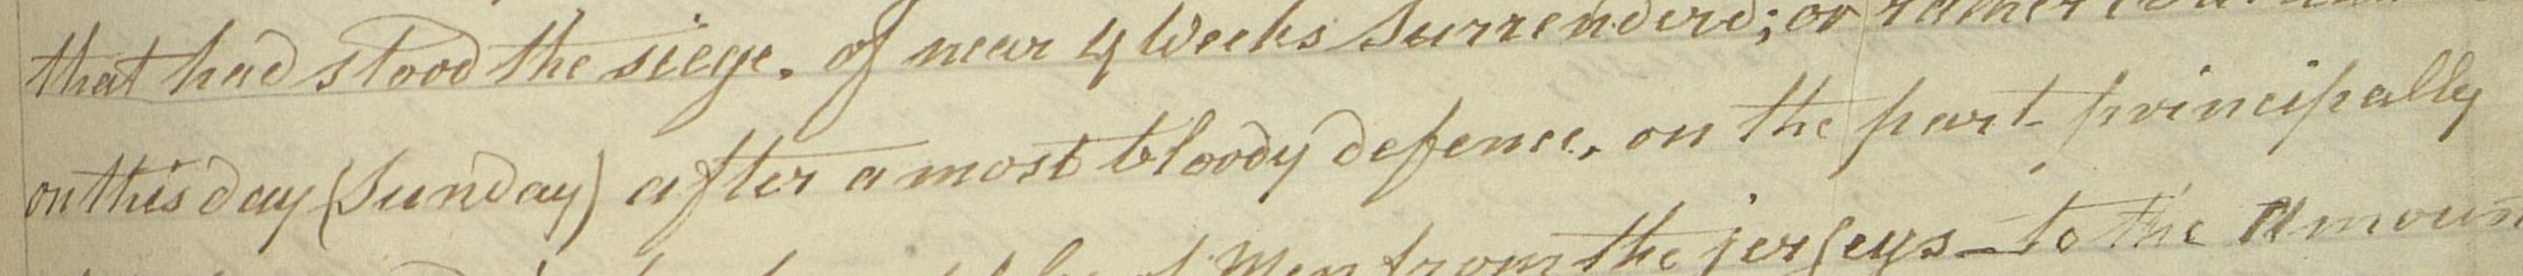on this day (Sunday) after a most bloody defence on the port principally
